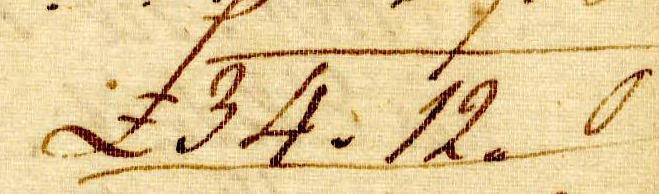£34.12. 0
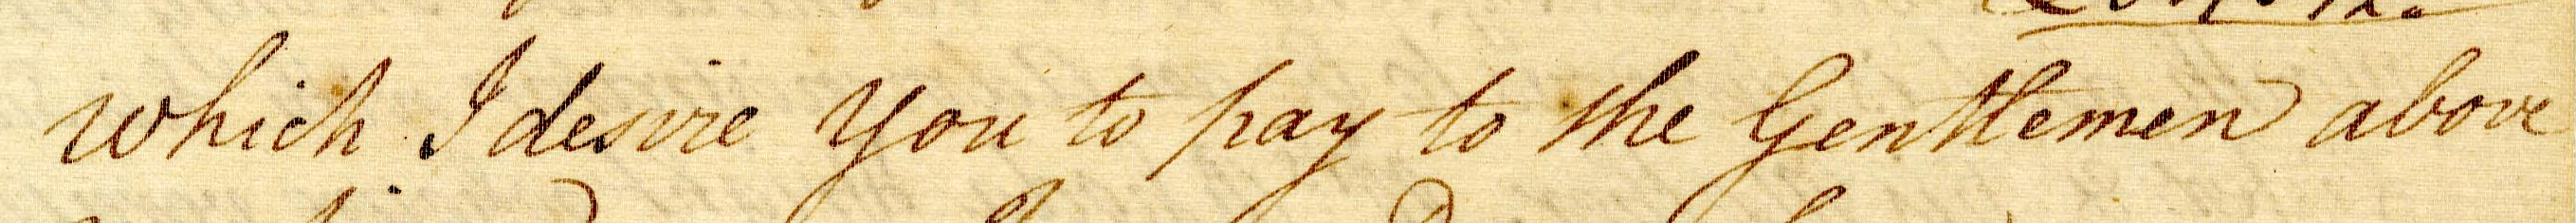Which I desire You to pay to the Gentlemen above
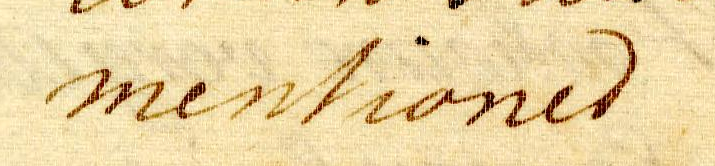mentioned
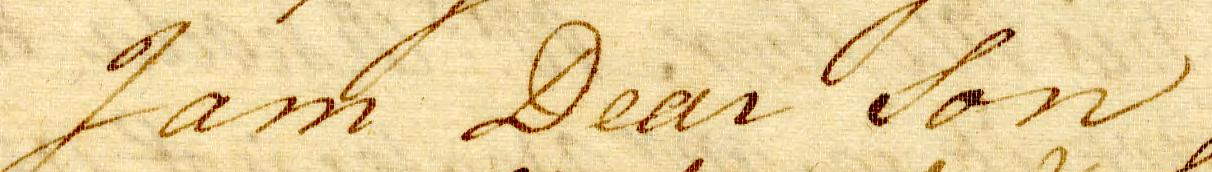I am Dear Son
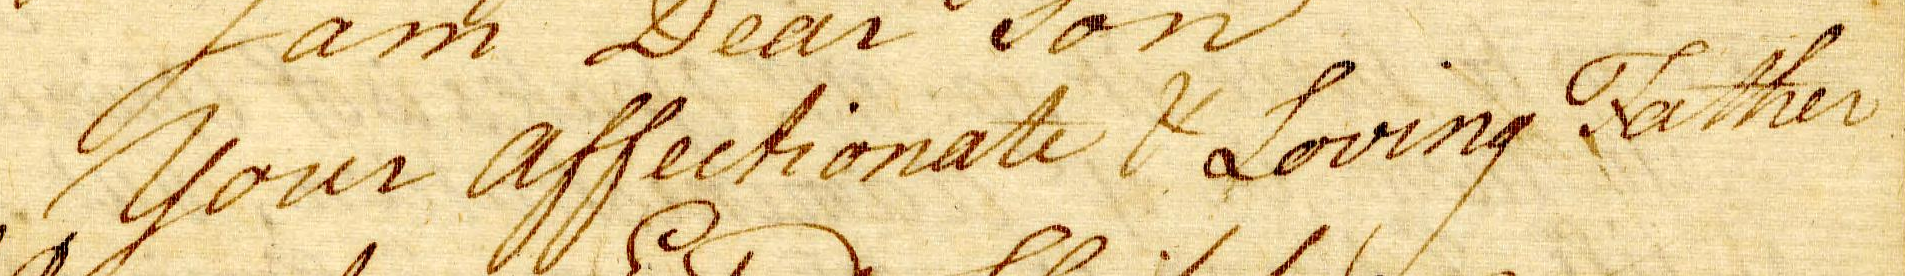Your Affectionate & Loving Father
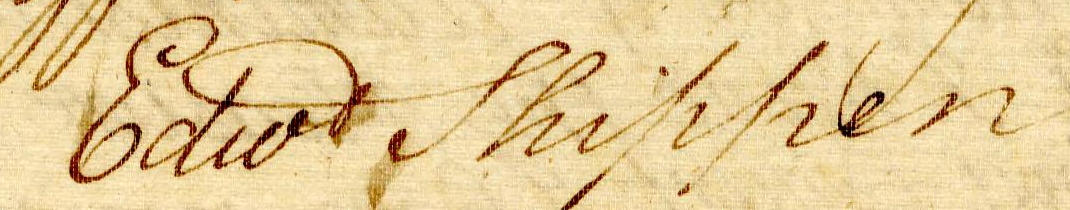Edw^d Shippen
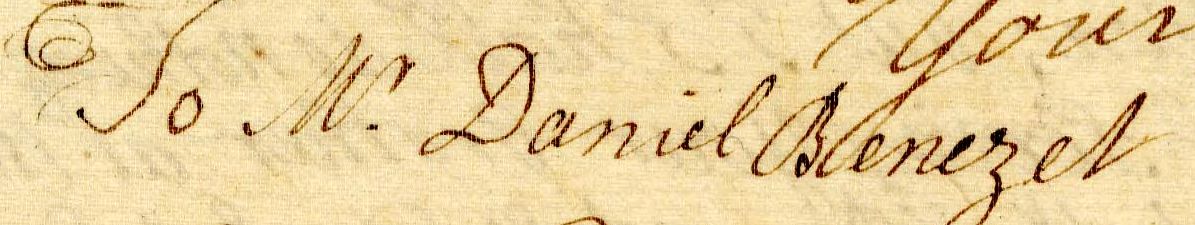To M^r. Daniel Benezet
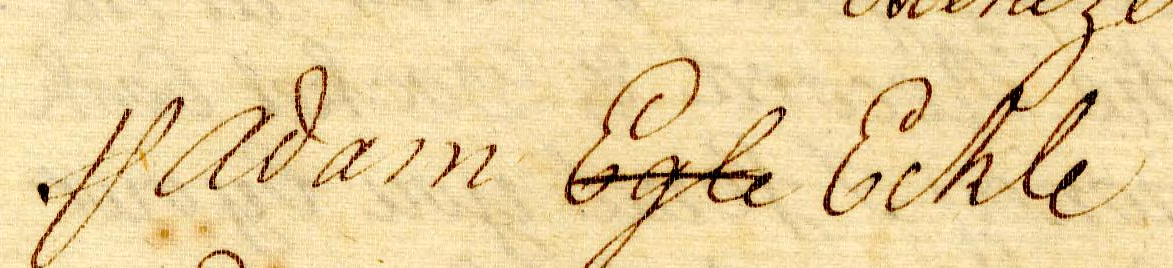per Adam [Egle] Eckle
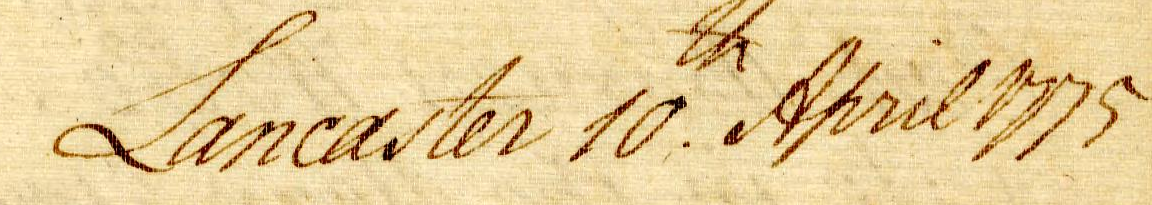Lancaster 10.^th April 1775
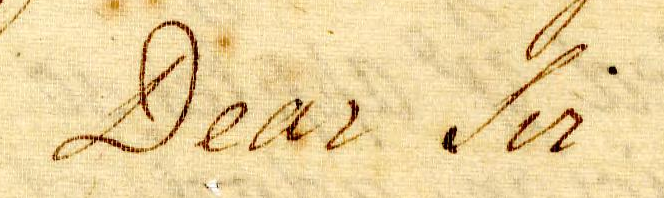Dear Sir
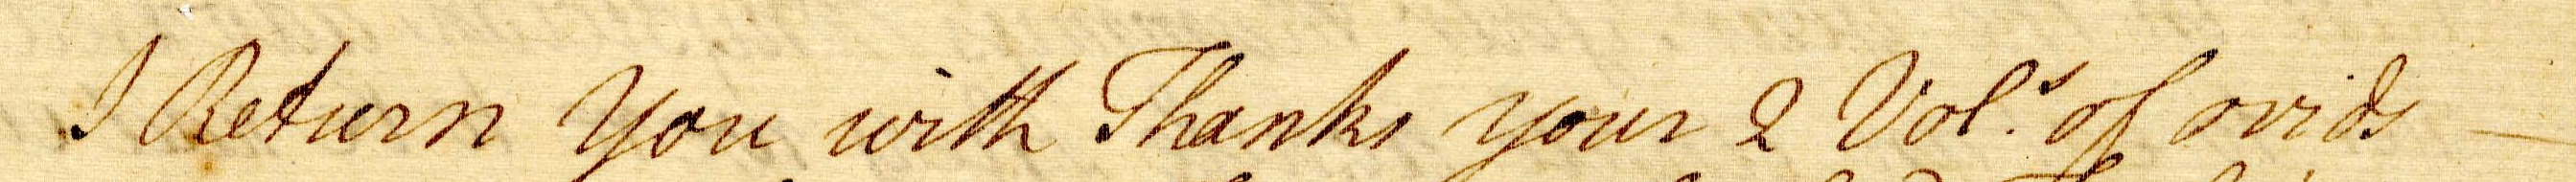I Return You with Thanks Your 2 Vol^s. of ovids -
